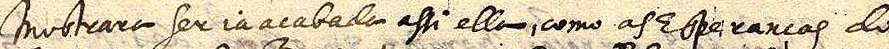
Mostrara ser ia acabada assi ella, como as Esperanças do
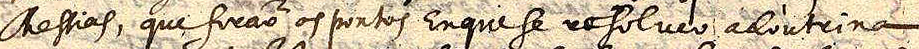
Messias, que foraõ os pontos En que se resolueo a doutrina
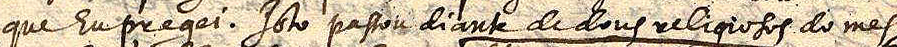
que Eu pregei. Jsto passou diante de dous religiosos do mes
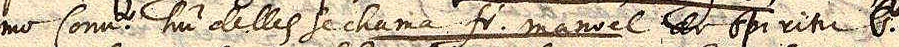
mo Conuto. hū delles se chama fr. manoel do spiritu sto.
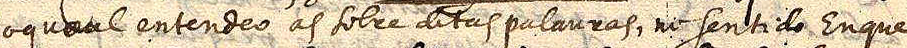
o qual entendeo as sobreditas palauras, no sentido En que
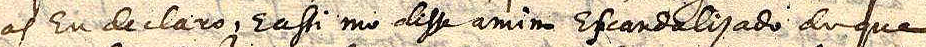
as Eu declaro, E assi mo disse a mim Escandalizado do que
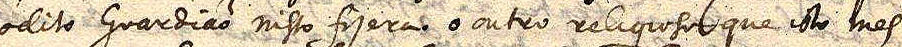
o dito Goardiaõ nisso fizera o outro religioso que isto mes
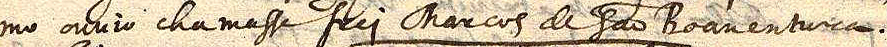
mo ouuio chamasse frej Marcos de sao Boauentura.
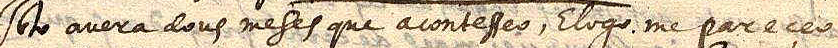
Jsto auera dous meses que acontesseo, E logo me pareçeo
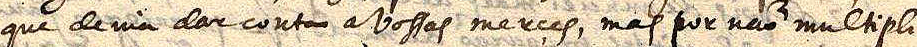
que deuia dar conta a Vossas merçes, mas por naõ multipli
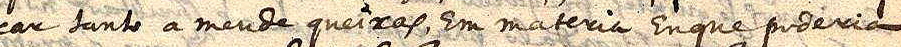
car tanto ameude queixas, Em materia En que poderia
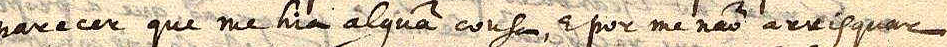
parecer que me hia alguā cousa, E por me naõ arrisquar
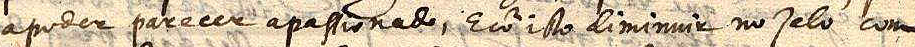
a poder parecer apassionado, E cō isto diminuir no zelo com
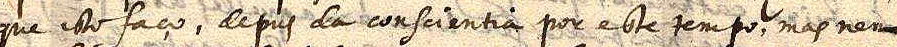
que isto faço, depus da conscientia por este tempo, mas nem
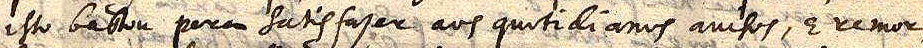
isso bastou para satisfazer aos quotidianos auisos, E remor
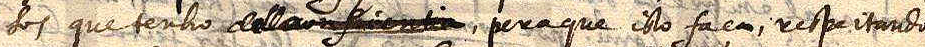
sos que tenho della onscientia, pera que isto faça, respeitando
